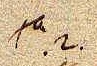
ta. 2.
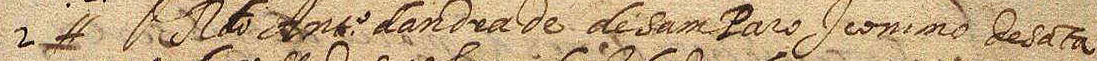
2 item O Rdo Ant.o dandrade de samPaio Jconimo de sāta
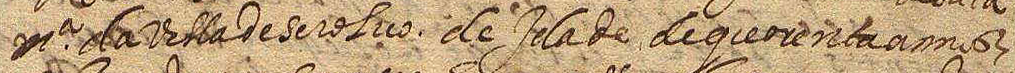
m.a da villa de serolico de Jdade de quorenta annos
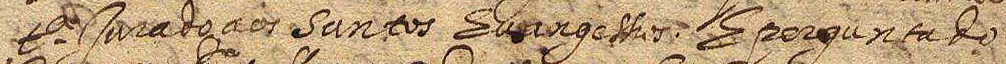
ta. Jurado aos Santos Euangelhos. E perguntado
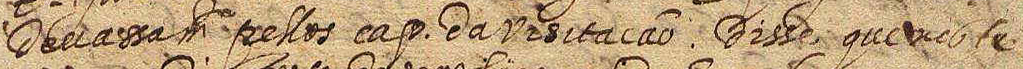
deuassamte pellos cap. da visitaçaõ. disse que neste
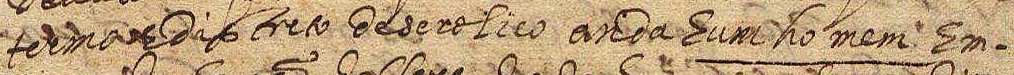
termo E distrito de serolico anda hum homem Em
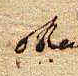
o Reo
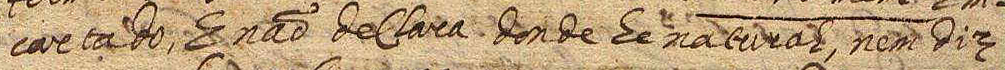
cartado, E não deClara donde he natural, nem diz
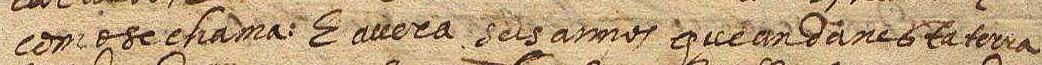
como se chama. E auera seis annos que anda nesta terra
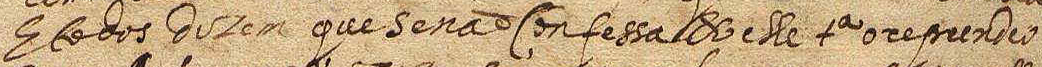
E todos dizem que se não Confessa & elle ta o reprendeo
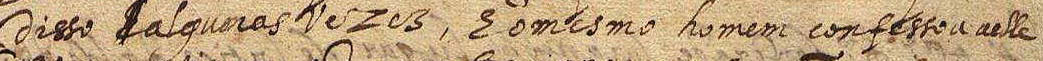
disso E algumas vezes, E o mesmo homem confessou a elle
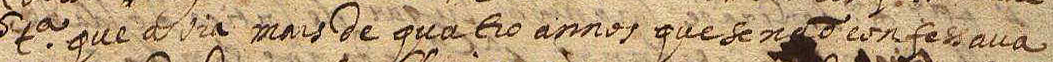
ta. que avia mais de quatro annos que se naõ confessaua
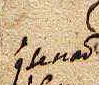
q̄ se naõ
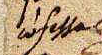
cōfessa
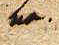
ua.
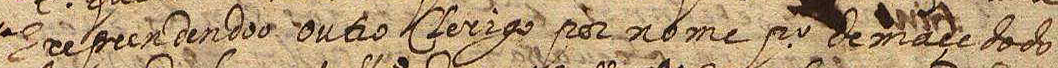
E reprendendoo outro Clerigo por nome p.o de macedo do
